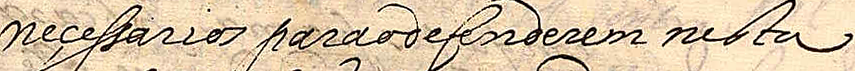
neçessarios para o defenderem nesta
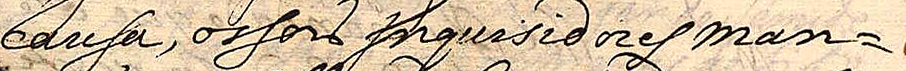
causa, os sors̅ Jnquisidores man
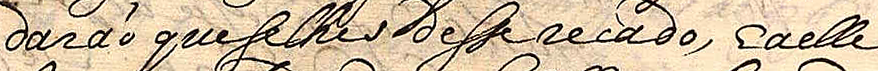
darão que se lhes desse recado, E a elle
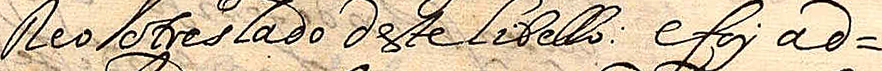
Reo o treslado deste Libello: e foy ad
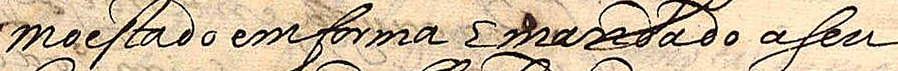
moestado em forma E mandado a seu
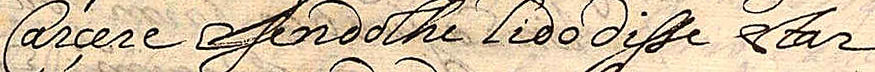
Carçere E sendolhe lido disse estar
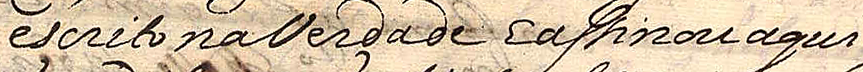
escrito na Uerdade E assinou aqui
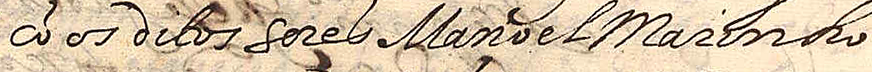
co̅ os ditos sores̅ Manoel Marinho
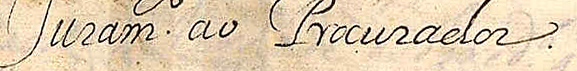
Juramto. ao Procurador
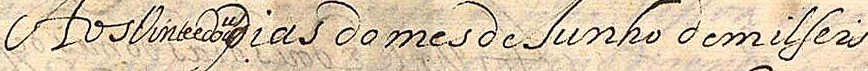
Aos vinte e dous dias do mes de Junho de mil seis
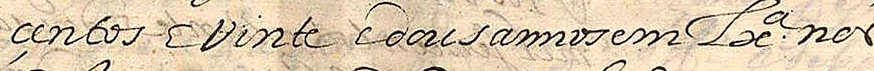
çentos E vinte e dous annos em Lxa. nos
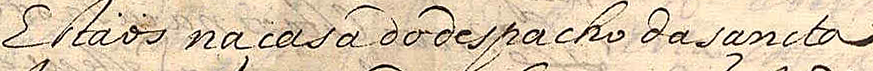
Estaos na casa do despacho da sancta
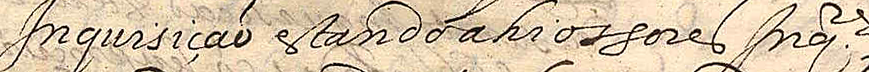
Jnquisição estando ahi os sores̅ Jnqres.
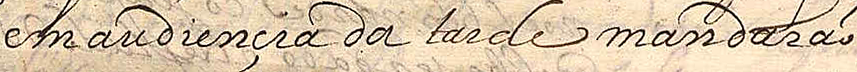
em audiençia da tarde mandarão
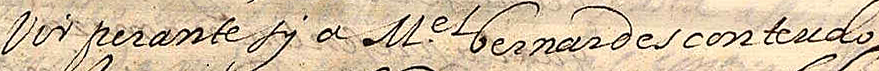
vir perante sy a M.el bernardes conteudo
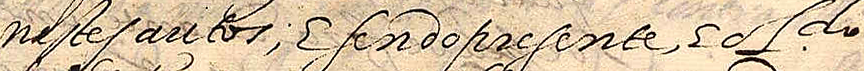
nestes autos; E sendo presente, E o Ldo.
